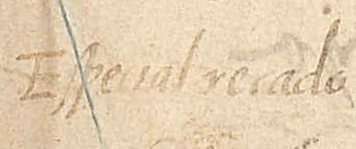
Especial recado
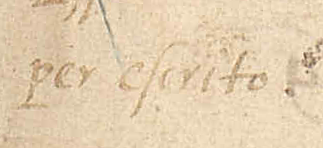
per escrito.
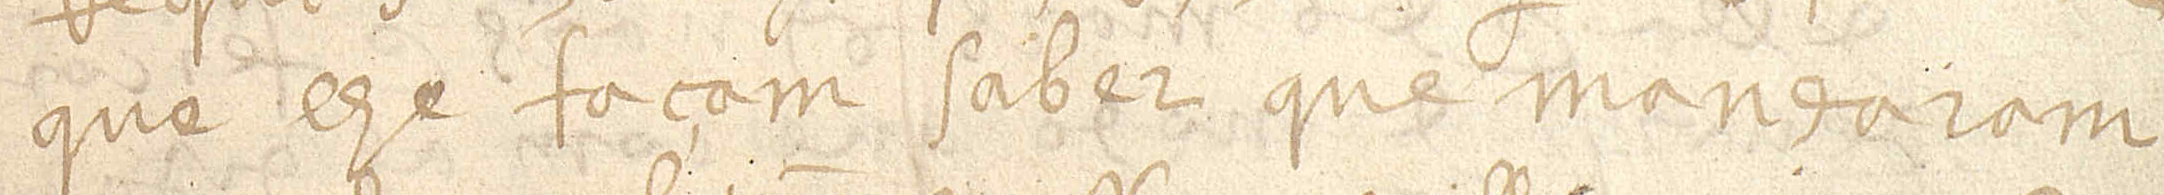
que lhe façam saber que mandaram
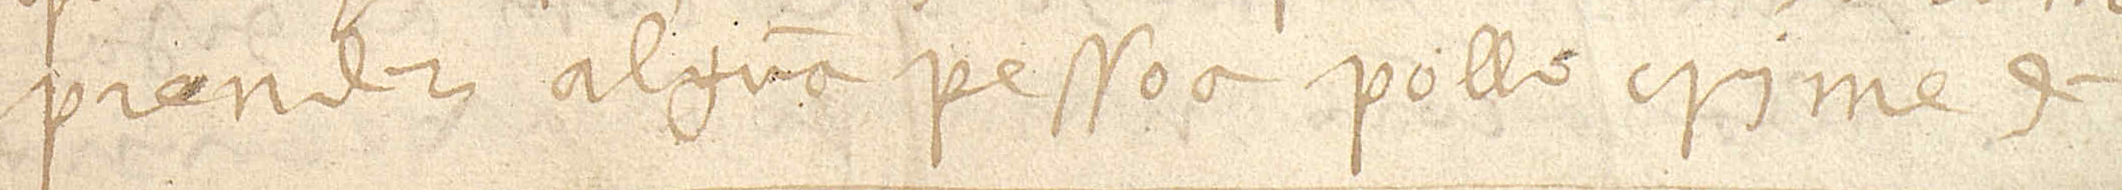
prender algūa pessoa pollo cryme de
